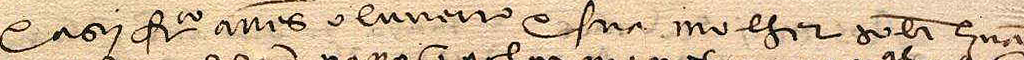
e asy frco an̄es o luneiro e sua molher sōbr huā
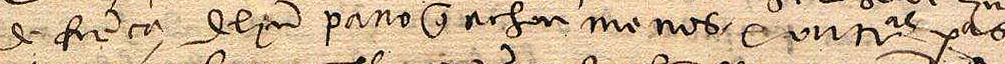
defrēça de hū pano q̄ achou menos e outras pas
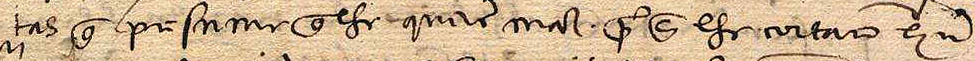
mtas q̄ presume q̄ lhe querē mal. p̄oq̄ lhe cortarō hū
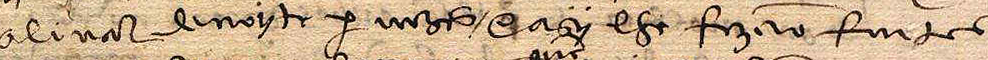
oliual de noyte ꝑ uezes / e asy lhe fezerō furtos
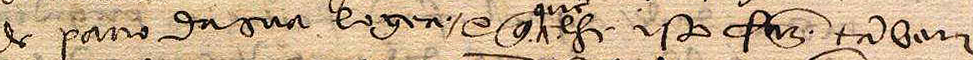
de pano da sua logea / e q̄ quē lhe isto faz. tābem
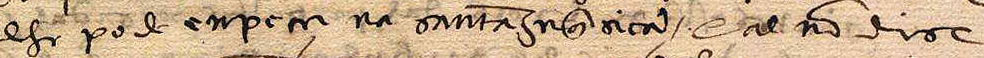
lhe pode enpecer na santa Jnq̄siçā / e al nō dise
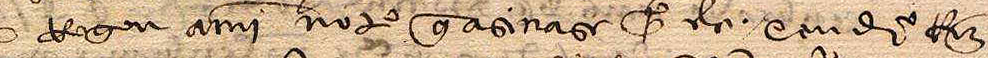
e Rogou a mj̄ noto q̄ asinase p̄o ela. e eu dio Rōz
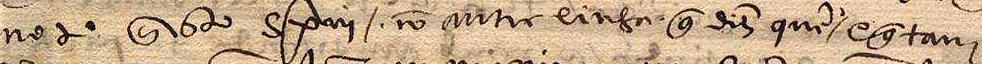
noto q̄ esto sp̄vy /. c̄o antrelinha q̄ diz quē / e q̄ tam
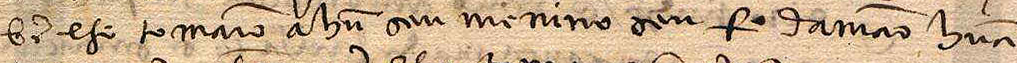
bē lhe tomarō a hū seu menino seu fo da mão huā
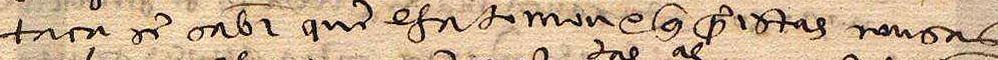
taça sē sab̄r quē lha tomou e q̄ p̄o estas cousas
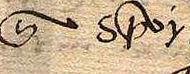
q̄ o sp̄vy /.
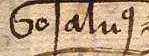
Gosaluꝯ
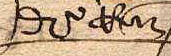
dio Rōiz
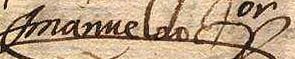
Jmanuel doctor
